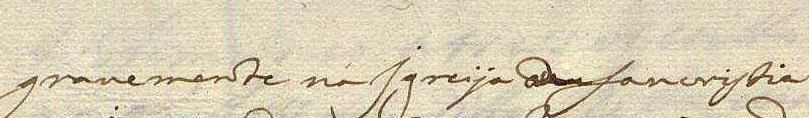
grauemente na Jgreija ou sancristia
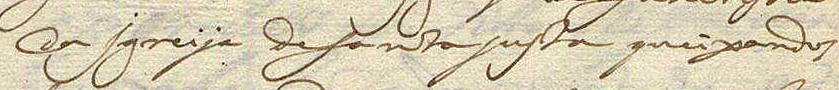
da Jgreija de santa justa queixandos
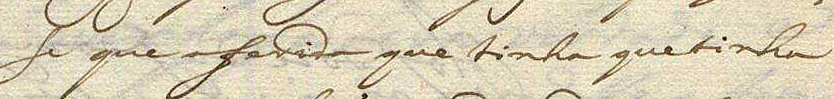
se que a ferida que tinha que tinha
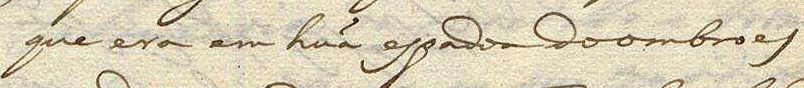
que era em huā espadoa do ombro es
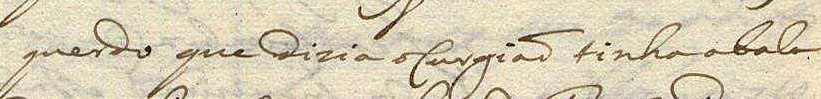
querdo que dizia o Curgiaõ tinha a bala
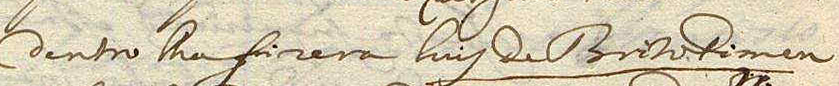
dentro lha fizera luis de Brito Pimen
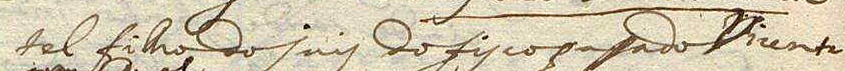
tel filho do Juis do fisco passado Vicente
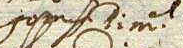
gomes Pim.el
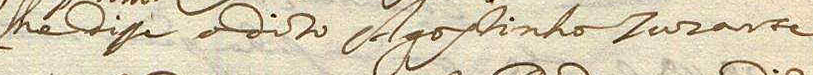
lhe disse o dito Agostinho Zuzarte
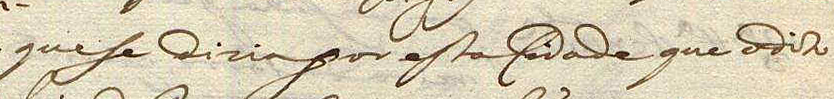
que se dizia por esta Cidade que o dito
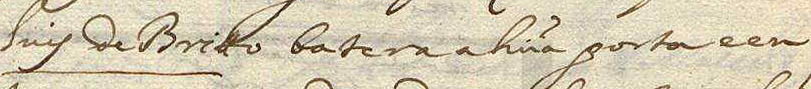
Luis de Britto batera a huā porta e en
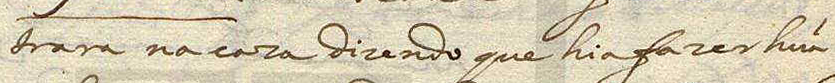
trara na caza dizendo que hia fazer huā
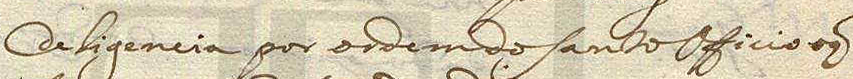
deligencia por ordem do Santo Officio o q̄
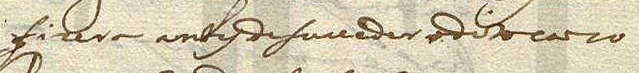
fizera antes de succeder o dito cazo
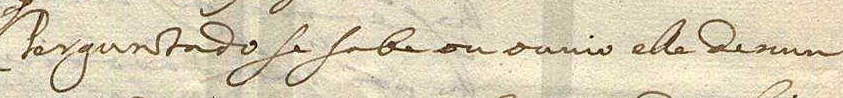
Perguntado se sabe ou ouuio elle denun
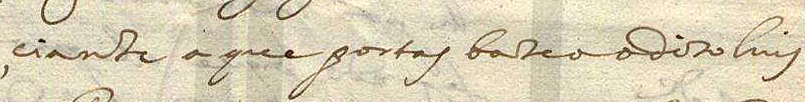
ciante a que portas bateo o dito luis
